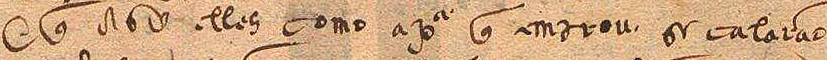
e q̄ Asy elles como a pa q̄ emtrou se calarão
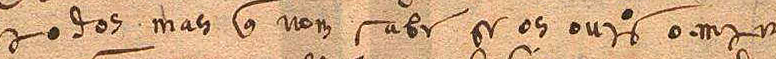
todos mas q̄ nom sabe se os outos o emtem
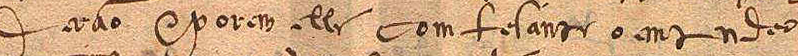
derão e porem elle comfesante o emtendeo
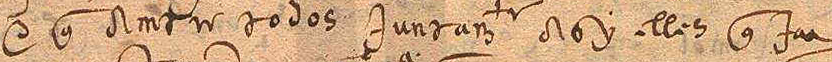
e q̄ Amtre todos Juntamte Asy elles q̄ Jaa
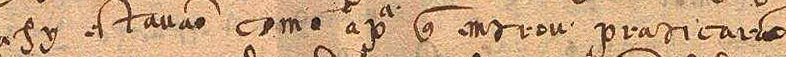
asy estauão como a pa q̄ emtrou praticarão
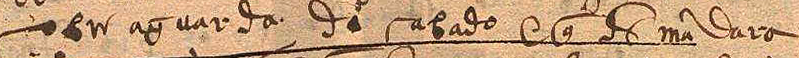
sobre a guarda do sabado e q̄ ds̄ mādara
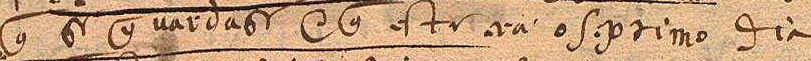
q̄ se guardase e q̄ este era o septimo dia
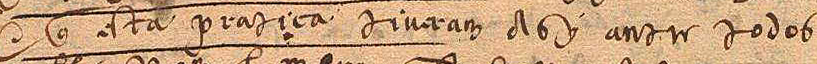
e q̄ esta pratica tiueram Asy antre todos
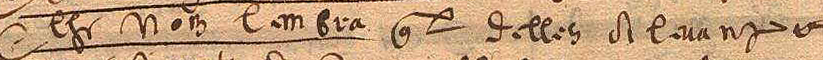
e lhe nom lembra q̄l delles Aleuantou
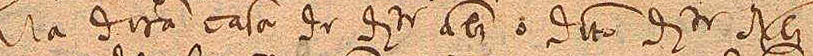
na ditā casa de drte al̄z o dit̄o drte Al̄z
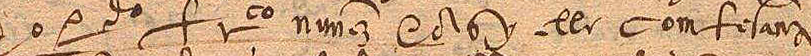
e o Ldo frco nun̄ez e Asy elle comfesante
